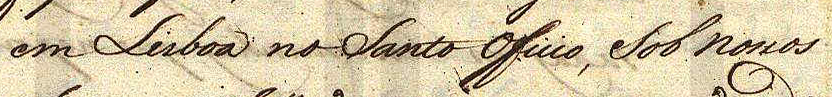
em Lisboa no Santo officio, Sob nossos
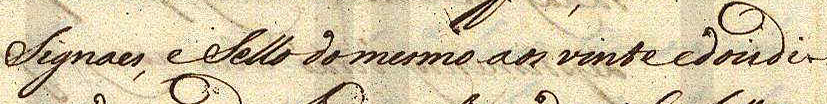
Signaes, e Sello do mesmo aos vinte e dois di
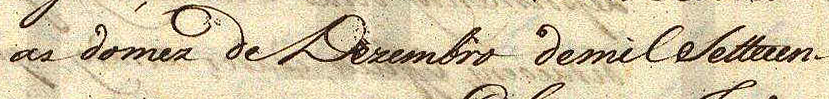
as do mez de Dezembro de mil Settecen
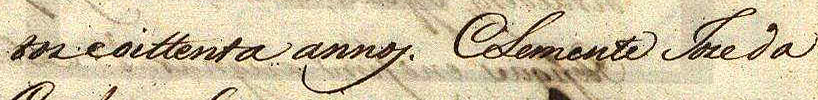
tos e oittenta annos. CLemente Ioze da
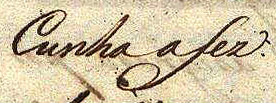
Cunha a fez:
